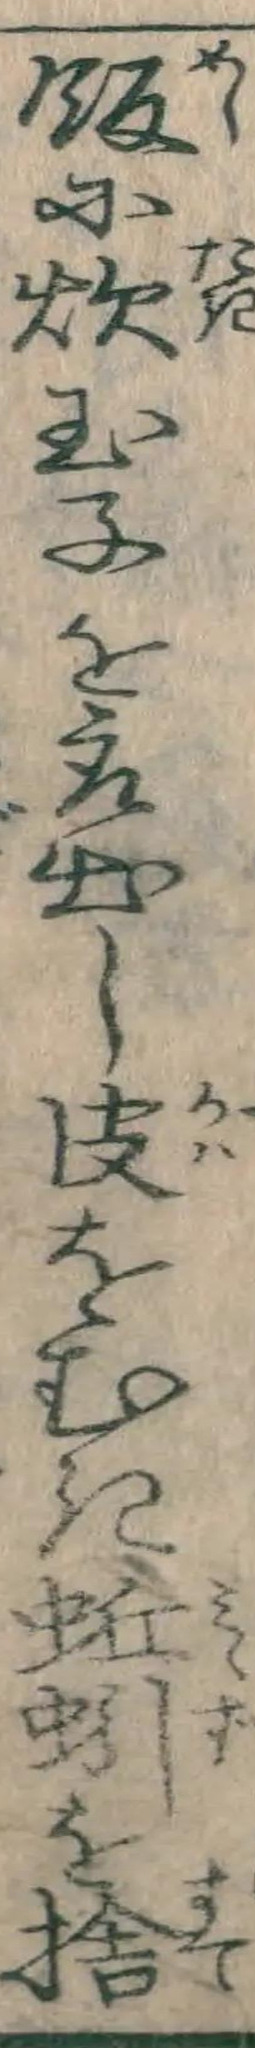飯に炊玉子を取出し皮をむき蚯蚓を捨
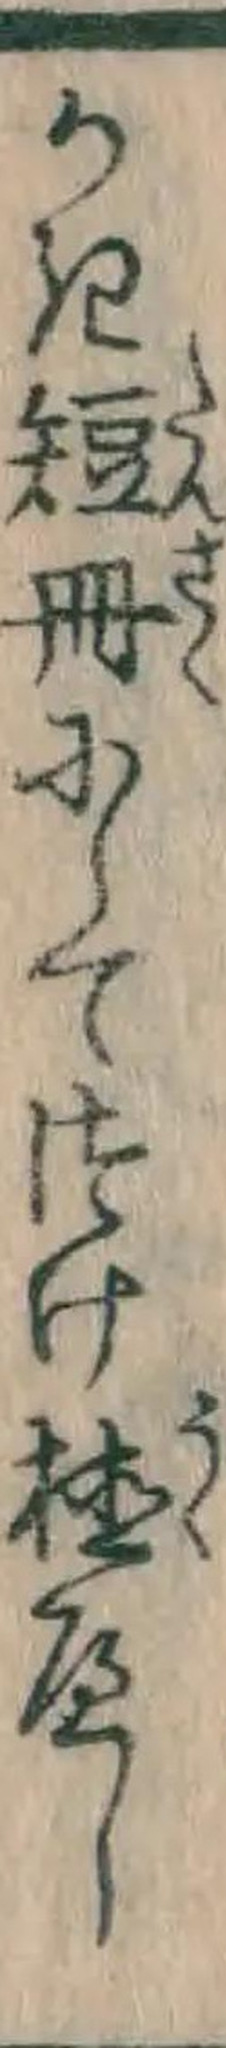かき短冊にしてつけ植へし
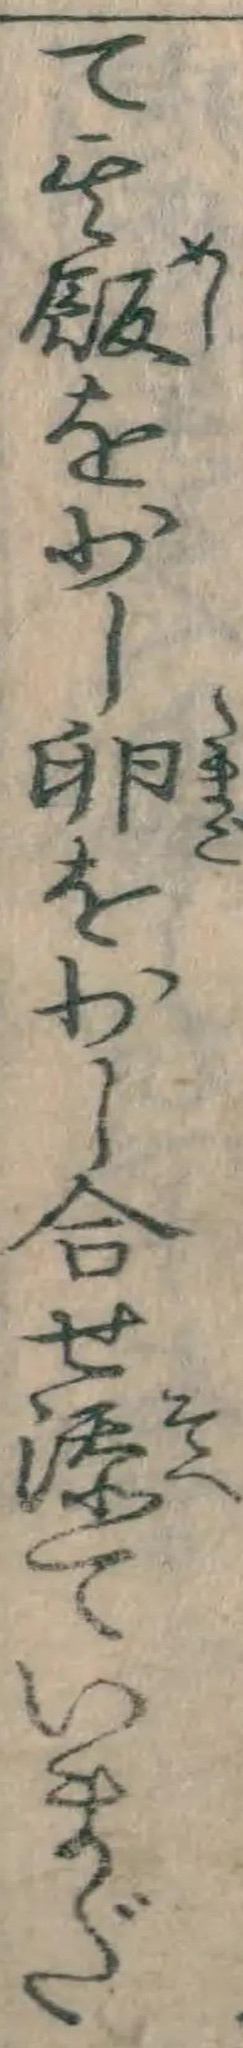て其飯を少し卵を少し合せ添ていまだ

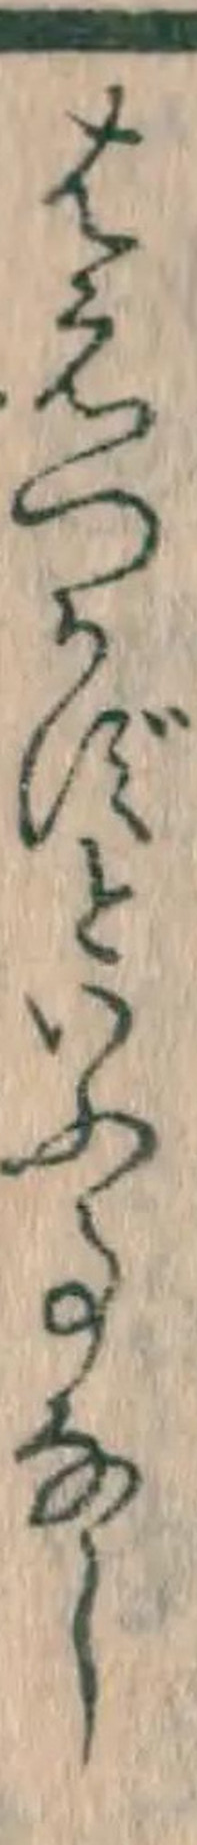はえつかずといふ事なし
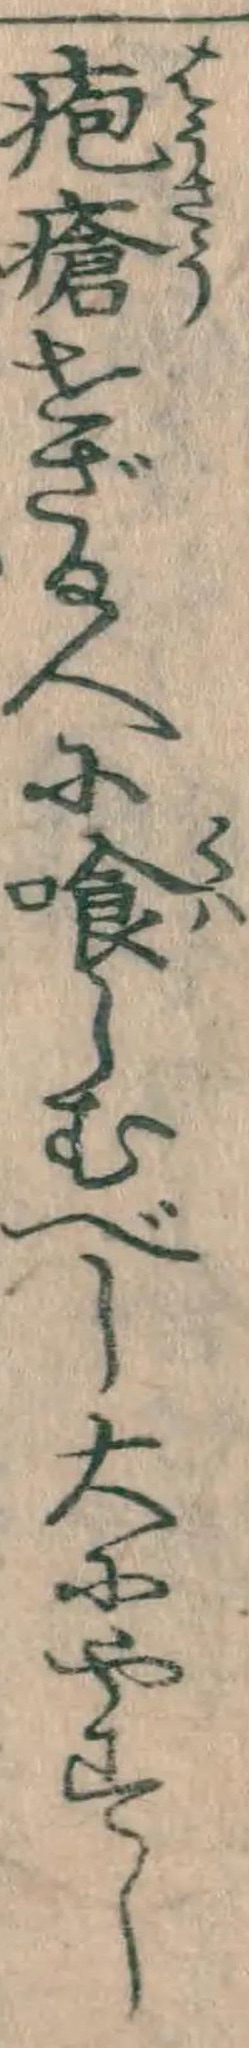疱瘡せざる人に喰しむべし大にやすし
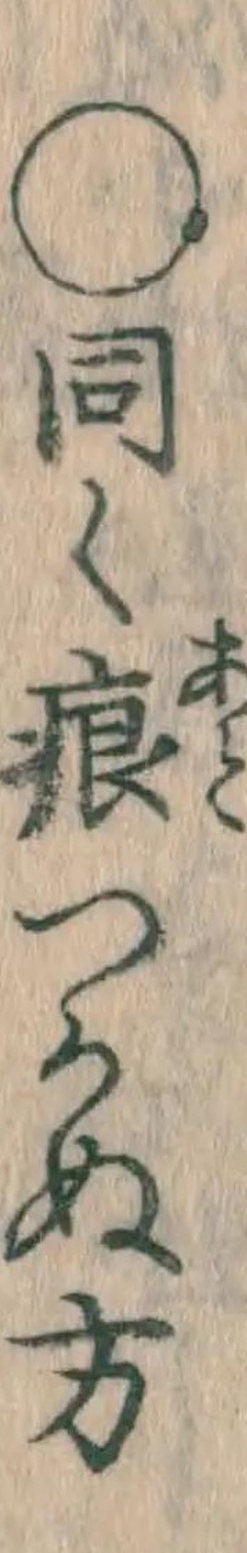○同く痕つかぬ方
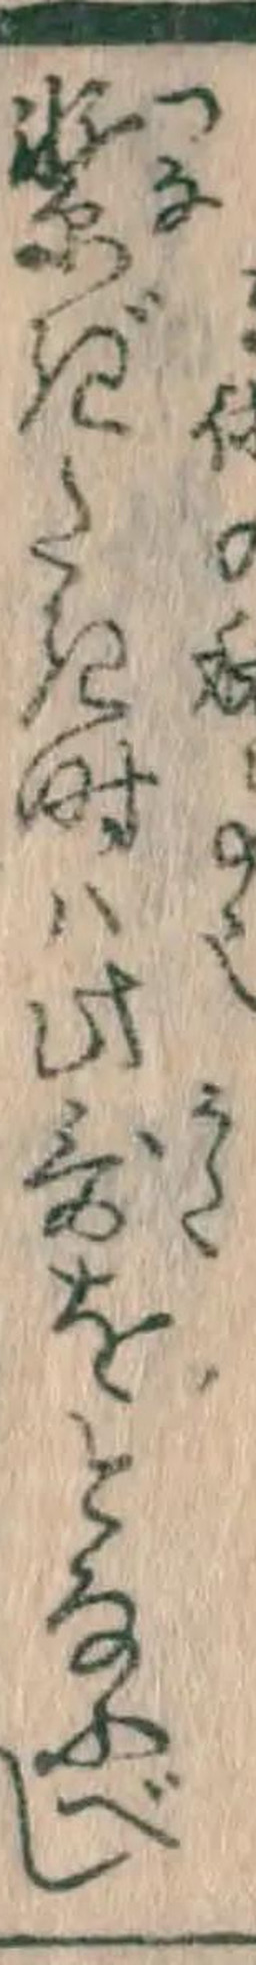繋ぎたき時は此歌をとなふべし
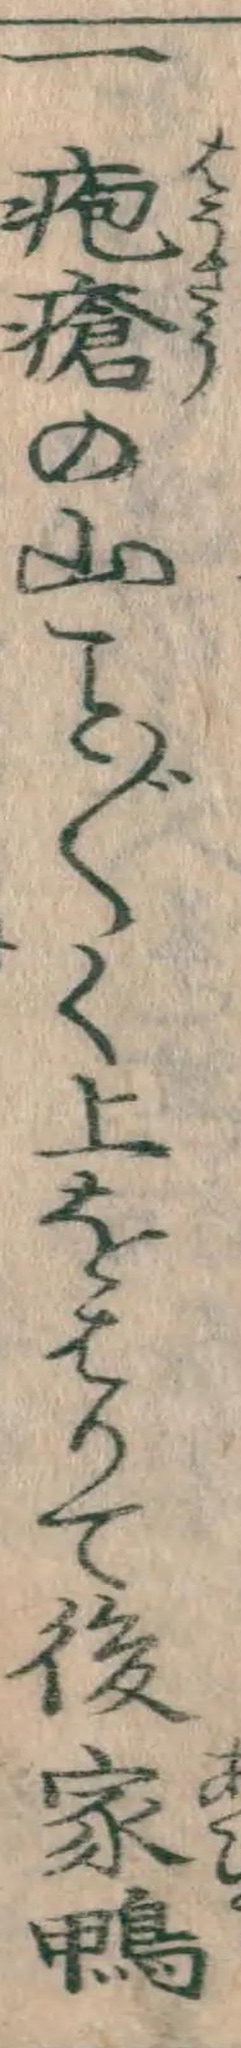一疱瘡の山こと〴〵く上をはりて後家鴨
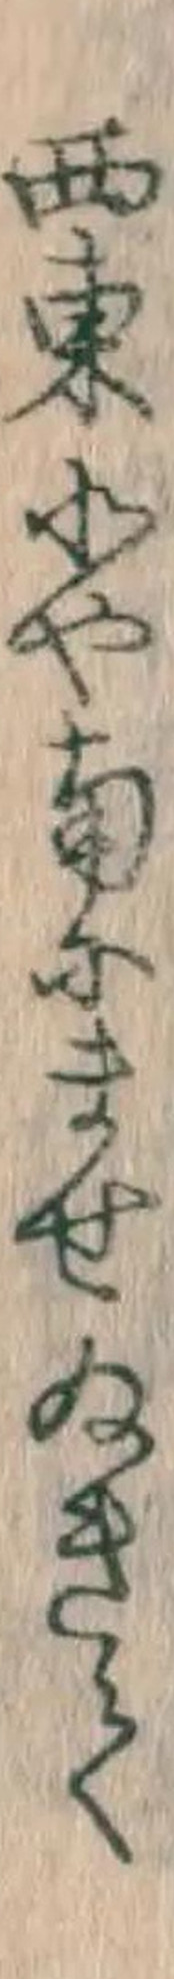西東北や南にませぬきて
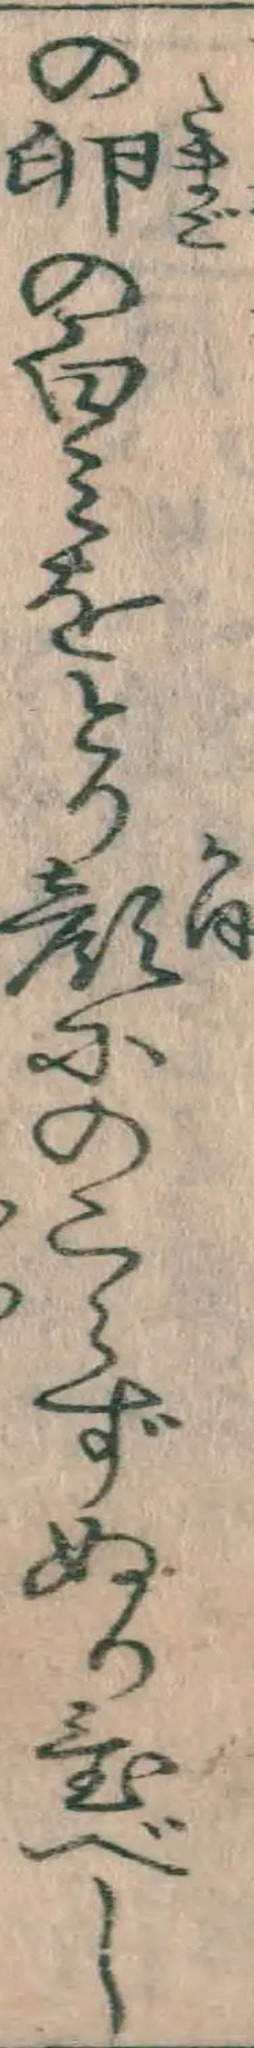の卵の白みをとり顔にのこらずぬり置べし
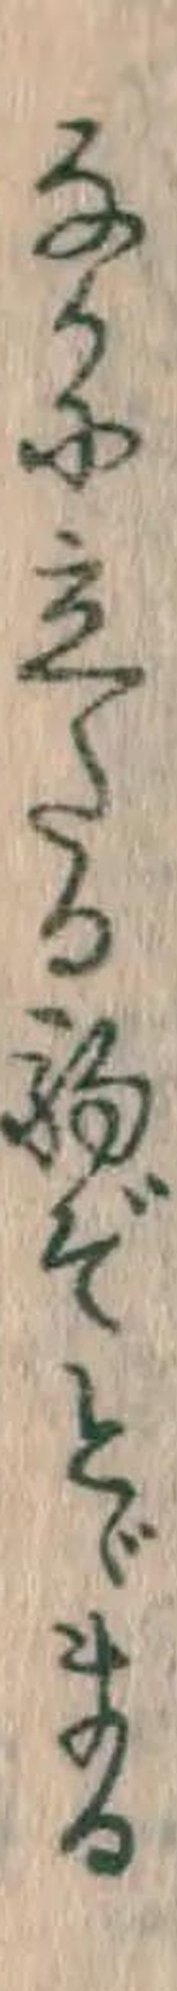なかに立たる駒ぞとゞまる
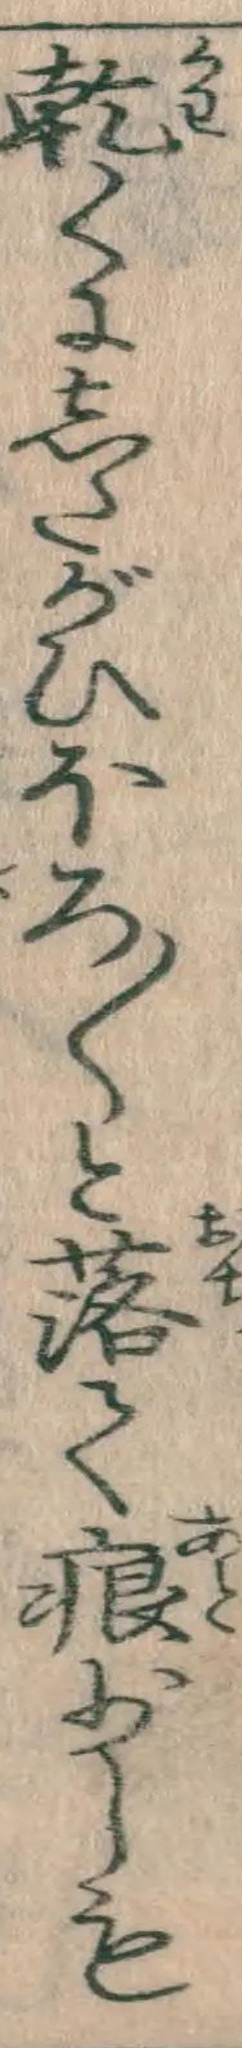乾くにしたがひほろ〳〵と落て痕少しも
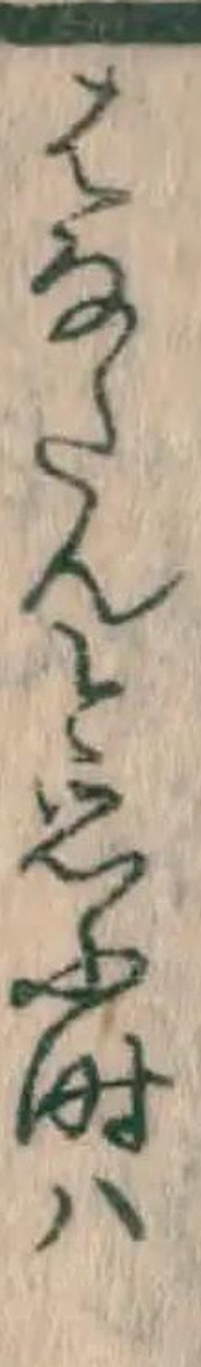はなたんと思ふ時は
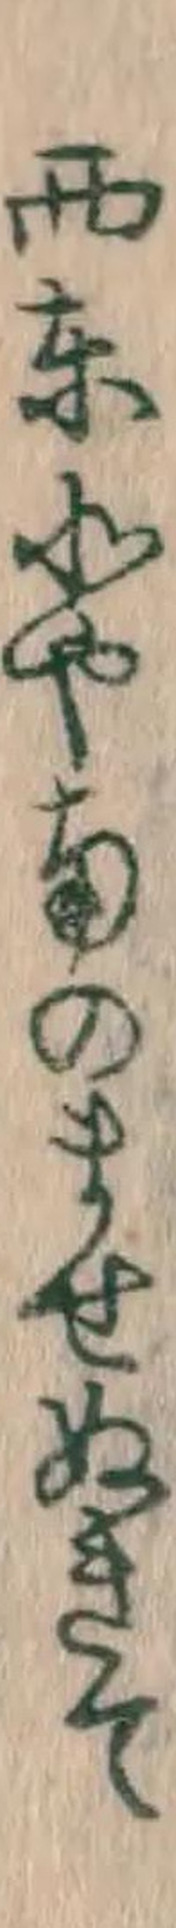西東北や南のませぬきて
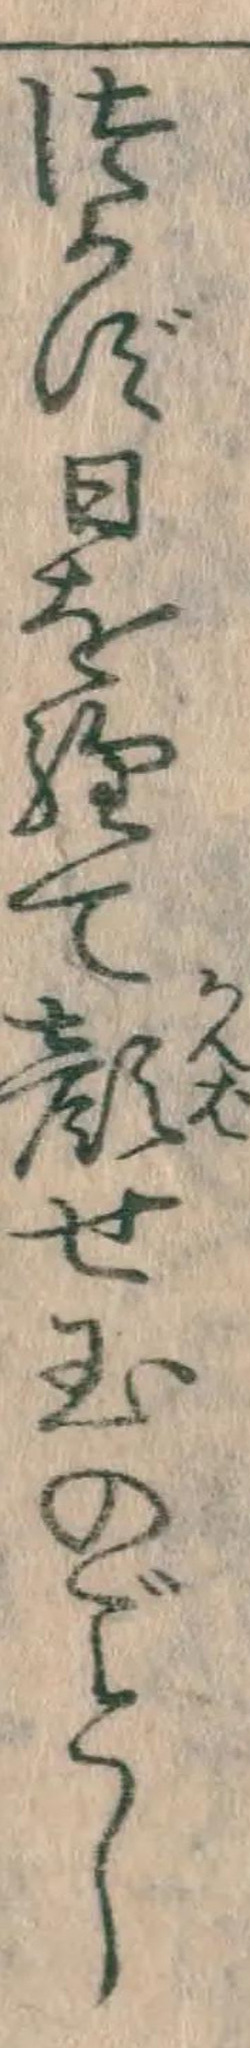つかず日を経て顔せ玉のごとし
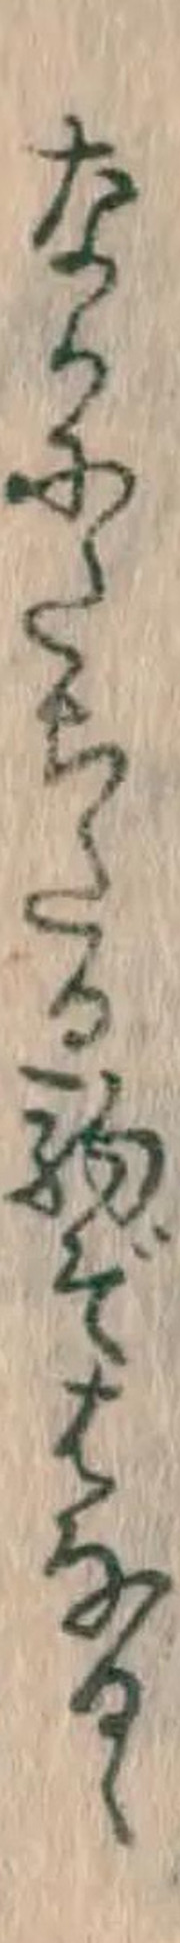なかにたちたる駒ぞはなるゝ
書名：広益秘事大全 3巻. [4]
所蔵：国立国会図書館 National Diet Library, JAPAN
